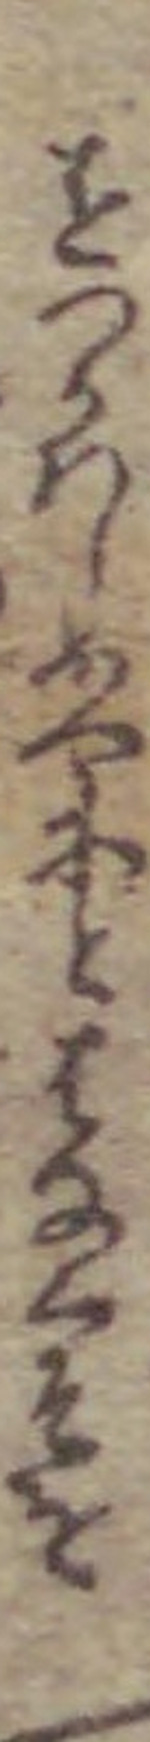をつかはしめやにとはなくそを
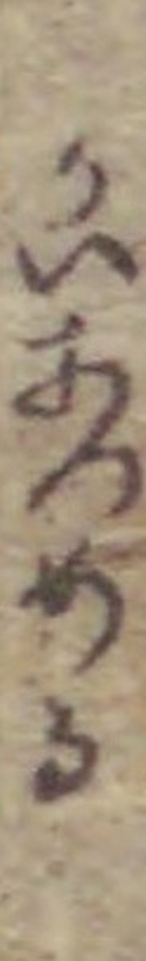かいあつめる

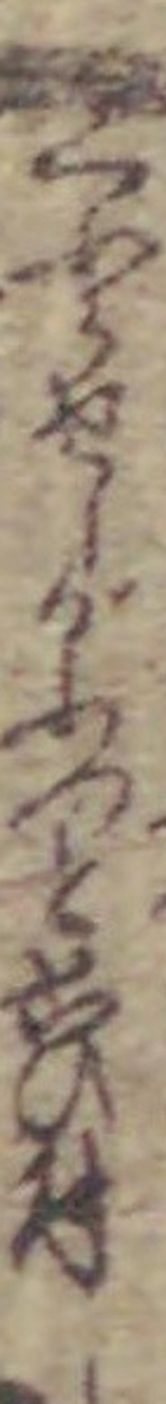くふうせしがふつと思ひ付
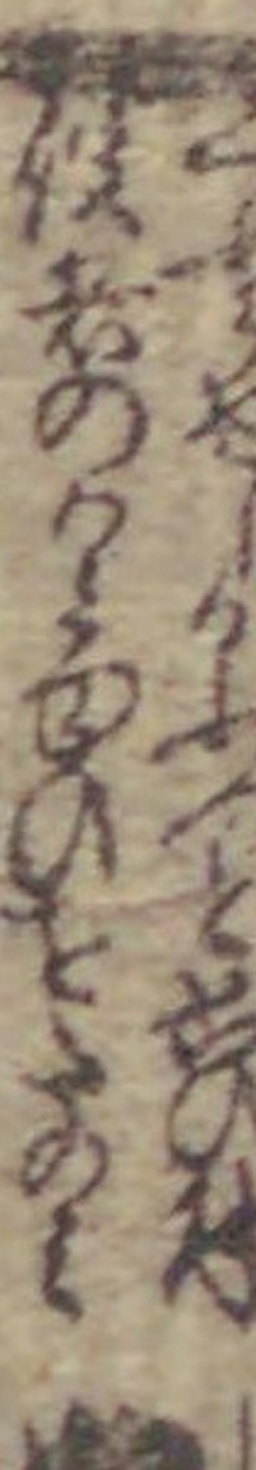役者のかみゆひをたのみ
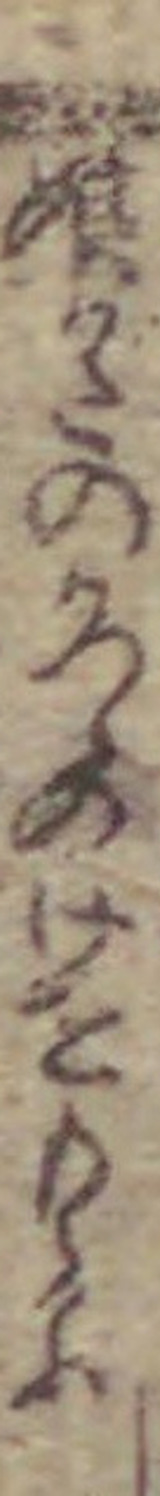娘がたのかつらのけをもらふ
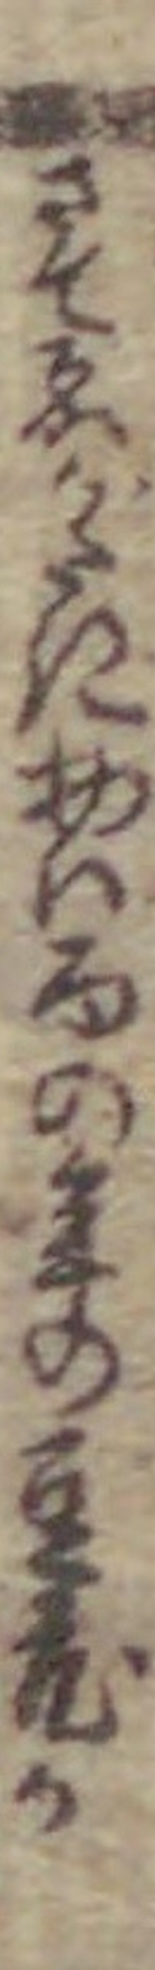さてゑかたき物は酉の年の豆蔵か
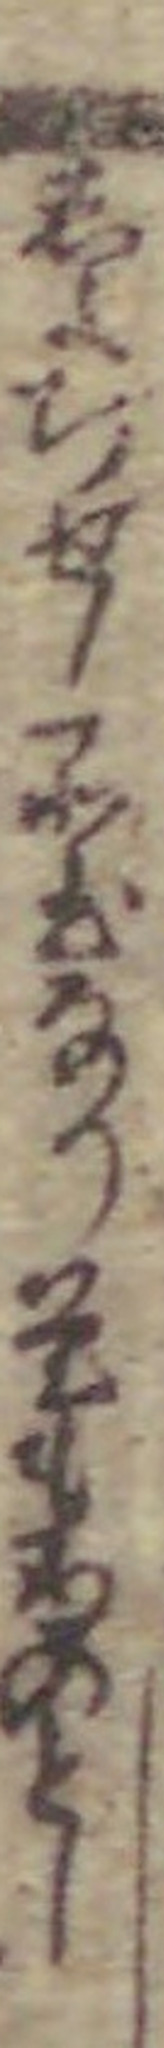しよちせし品玉なり是も酉のとし
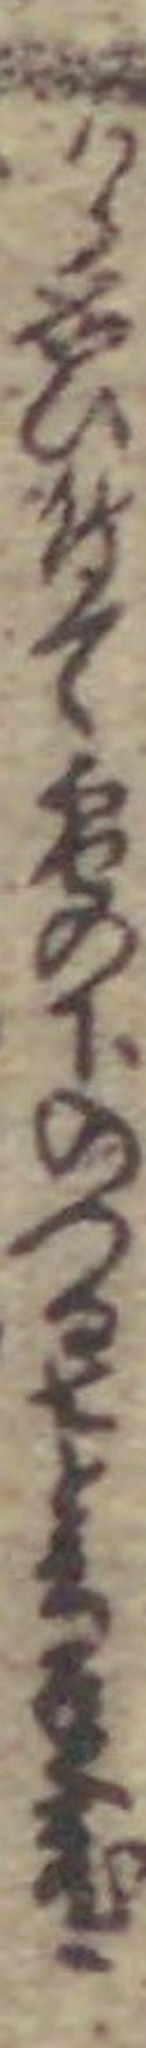から思ひ付て雪の下のつる七と云豆蔵
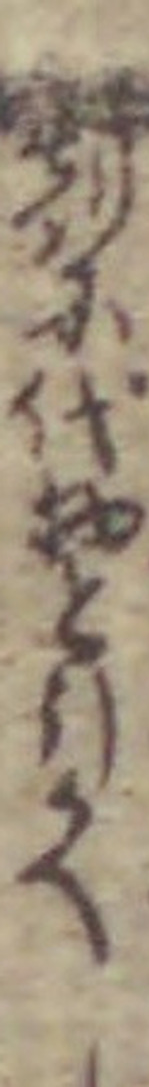刻に代物と引かへ
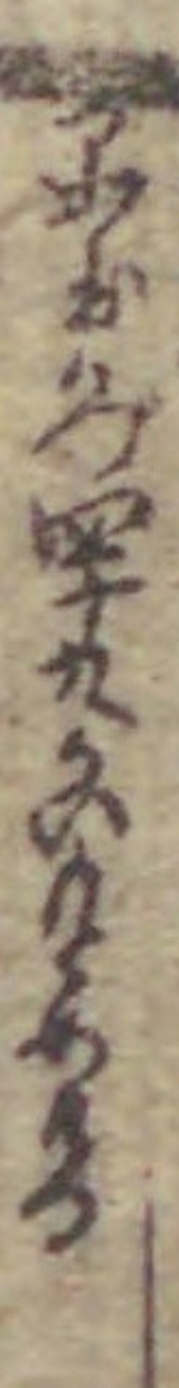品玉かづ四十九かいもとめける
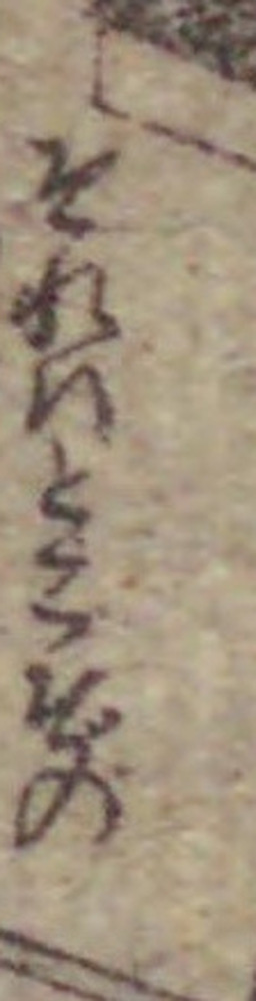それはとこぞの
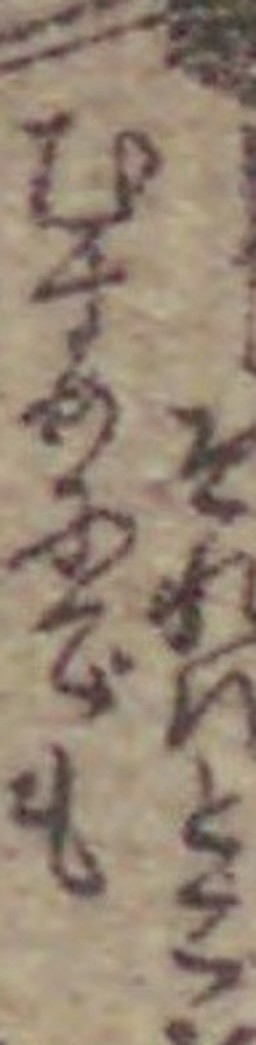むすめにでも
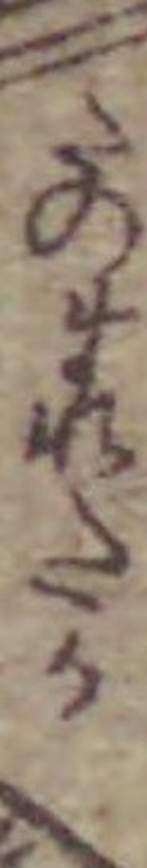たのまれたか
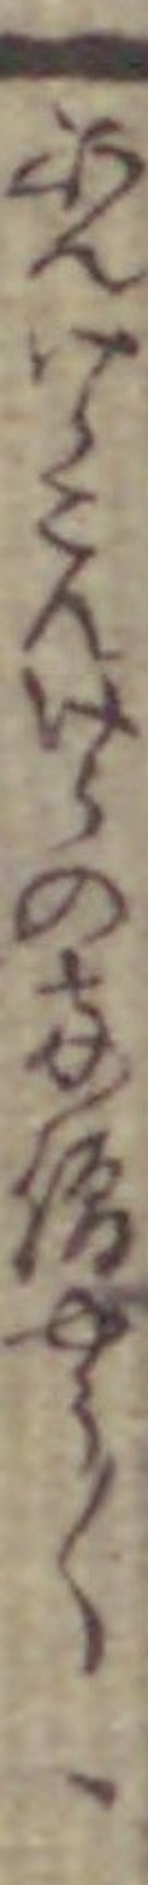あんけらこんけらの両僧やう〳〵
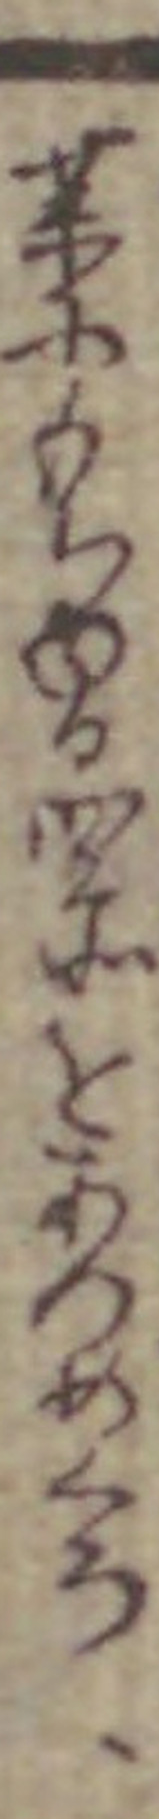薬にもちゆる四品をあつめくろ
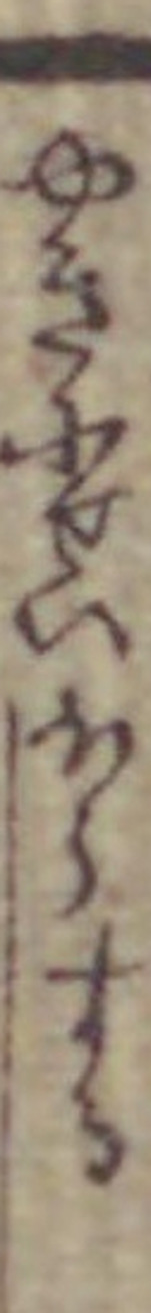やきにせいほうする
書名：止而道致虚録 3巻
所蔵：国立国会図書館 National Diet Library, JAPAN
